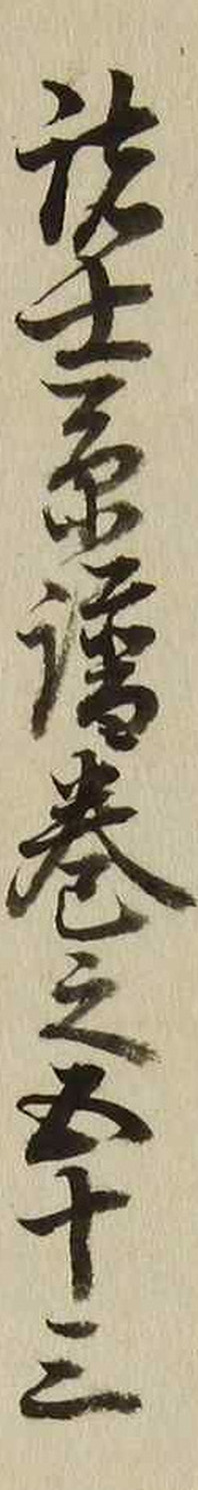諸士系譜巻之五十三
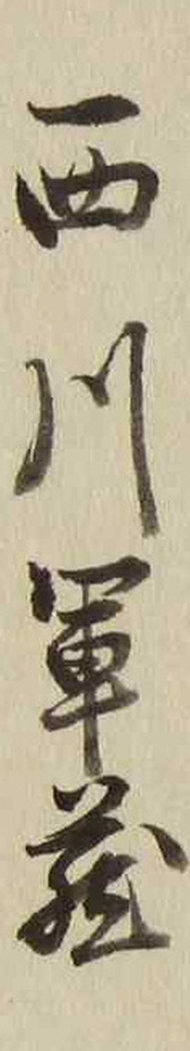西川軍蔵

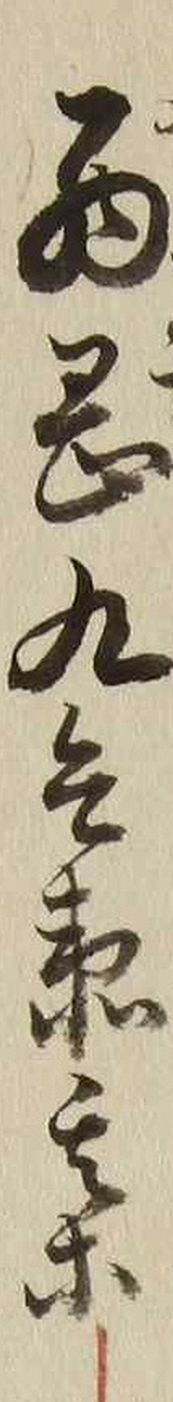西岡九兵衛某
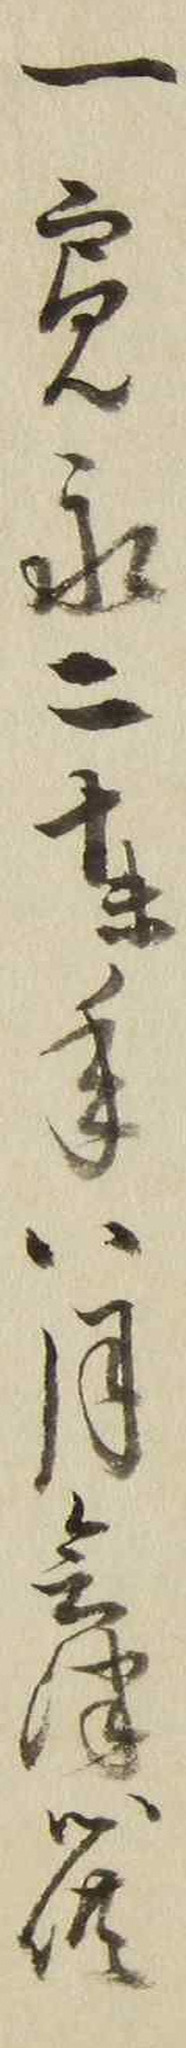一寛永二十未年八月会津へ御供
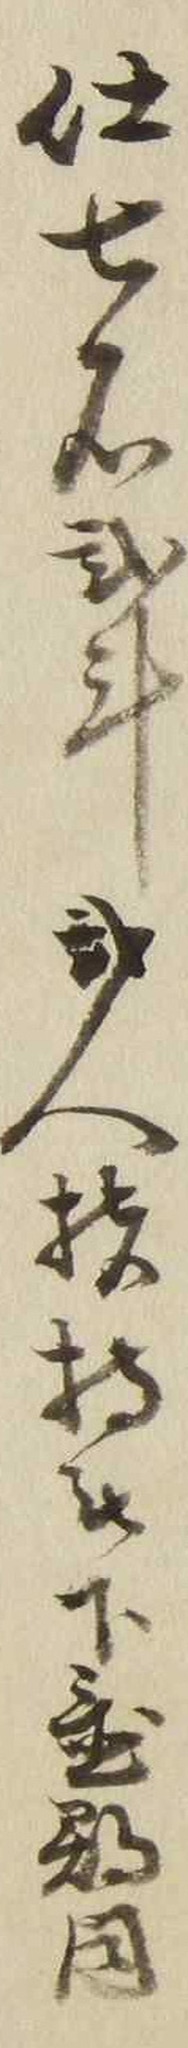仕七石弐斗弐人扶持被下置郡同

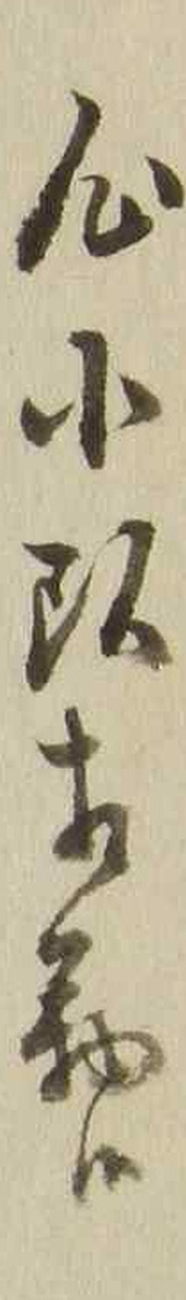心小頭相勤候
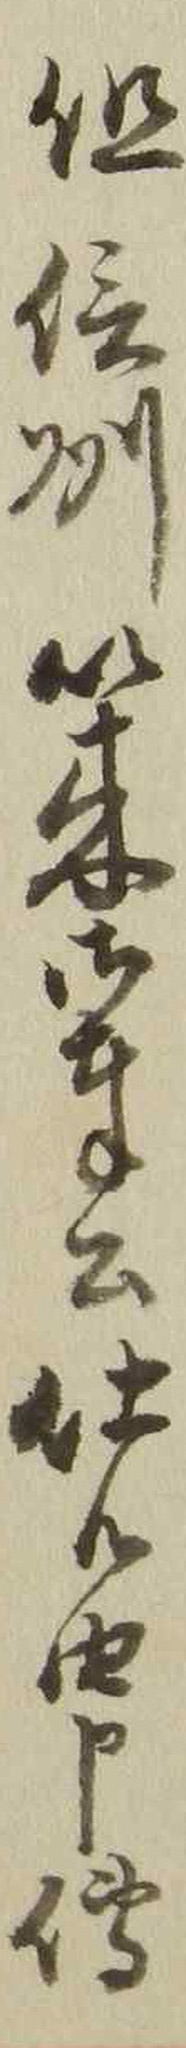但信州以来御奉公仕候由申伝
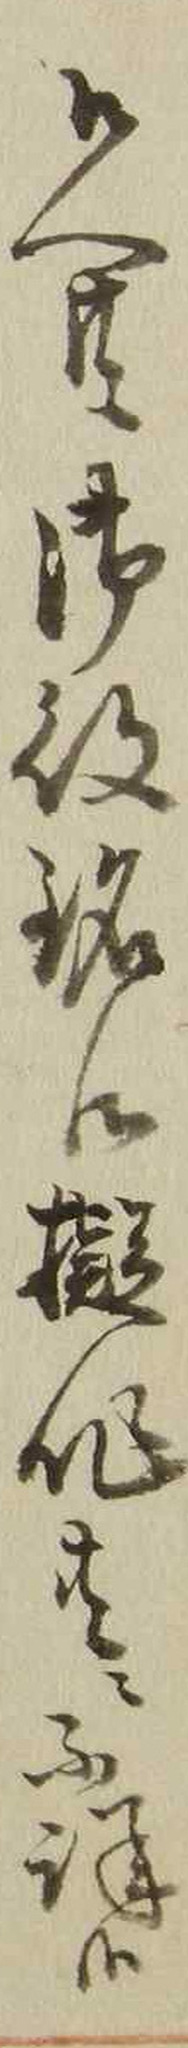候へ共御役銘御擬作共ニ不詳候
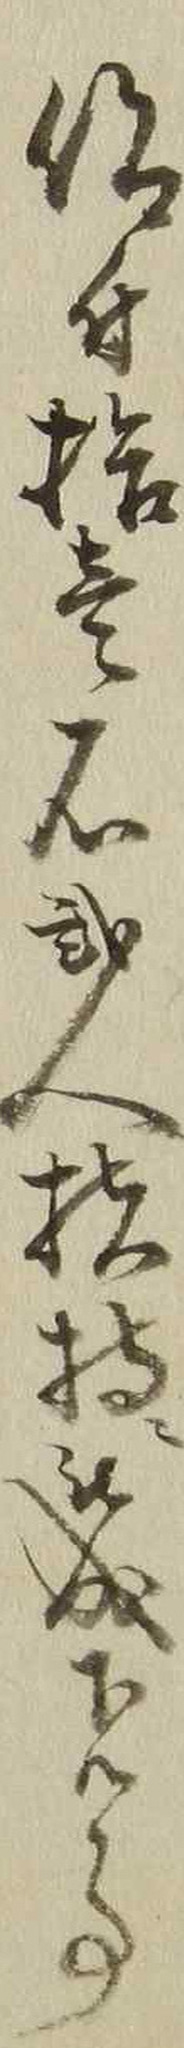仰付拾壱石弐人扶持ニ被成下候事
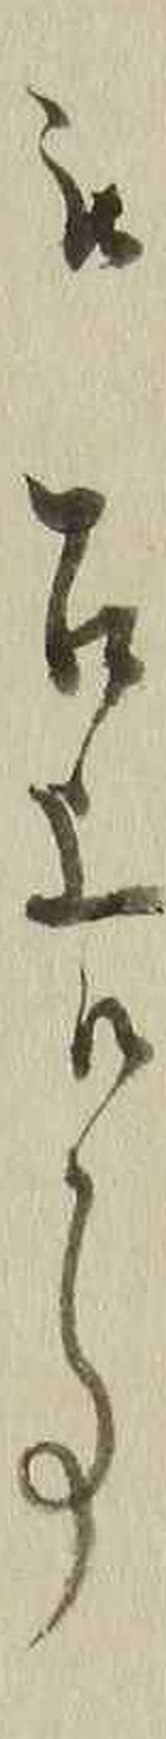被召上候事
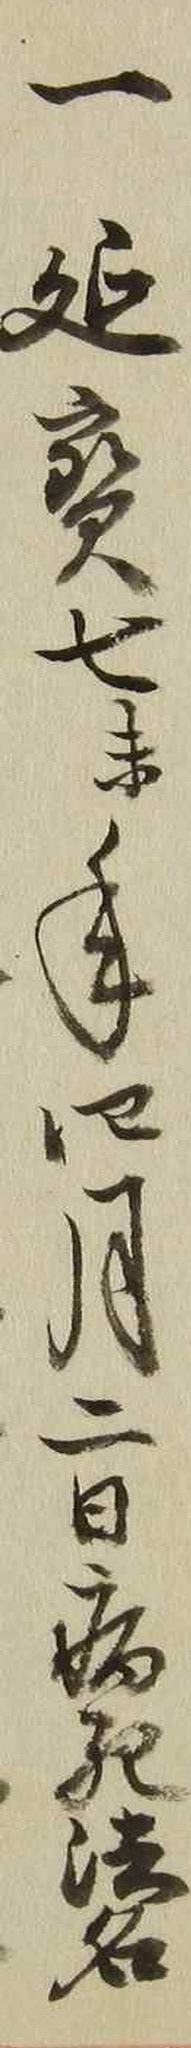一延宝七未年四月二日病死法名
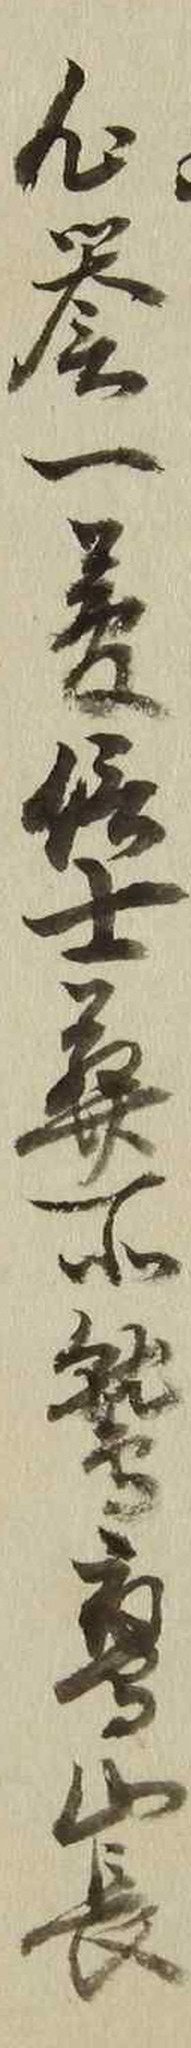心誉一夢信士葬所鷲鷹山長
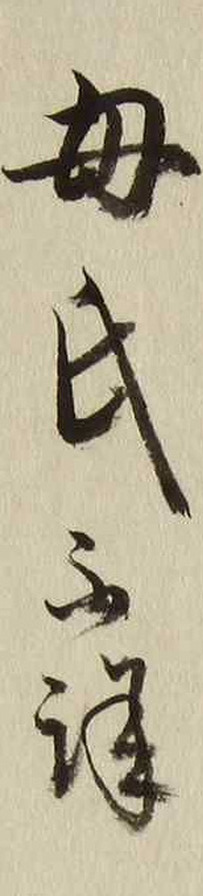母氏不詳
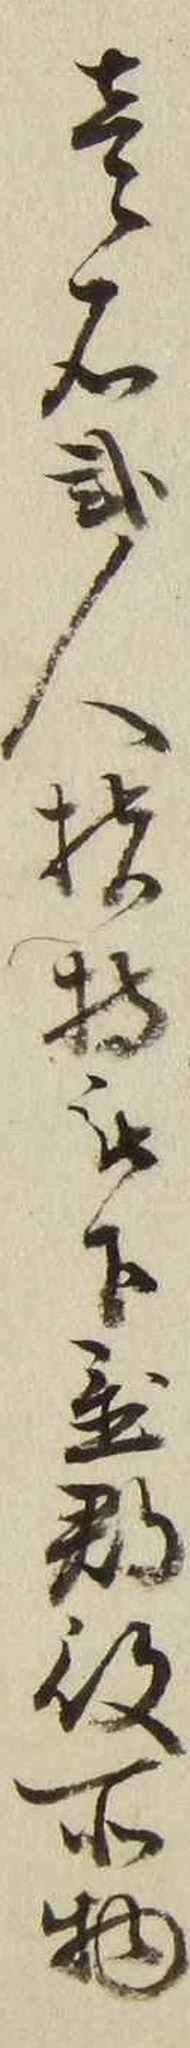壱石弐人扶持被下置郡役所物

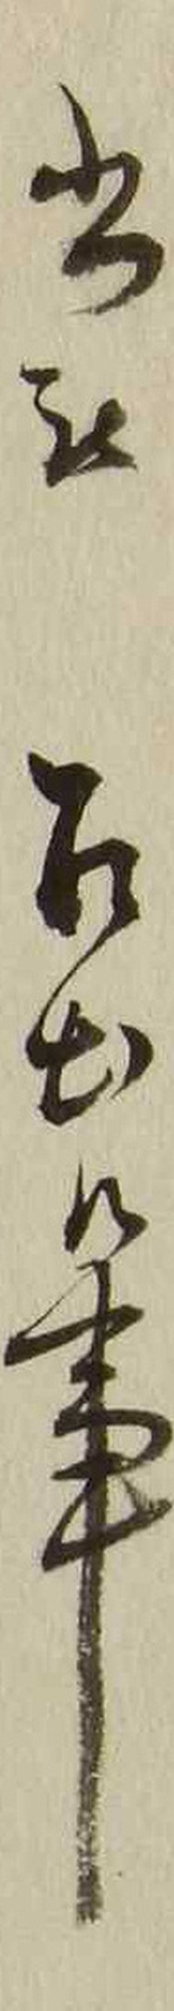書被召出候事
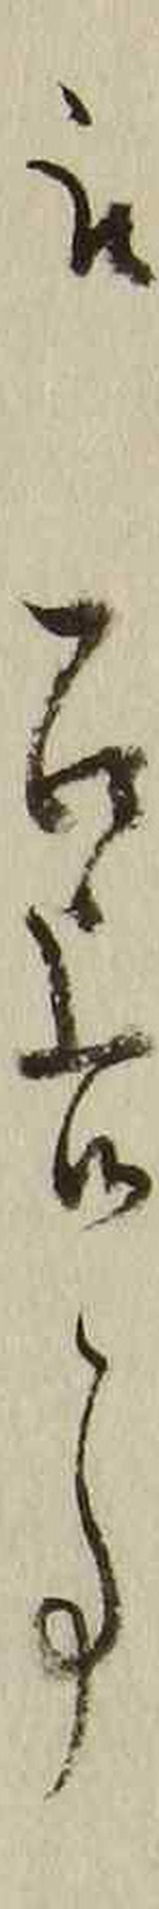被召上候事
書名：諸士系譜　巻之53　に之部4
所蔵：会津若松市立会津図書館
